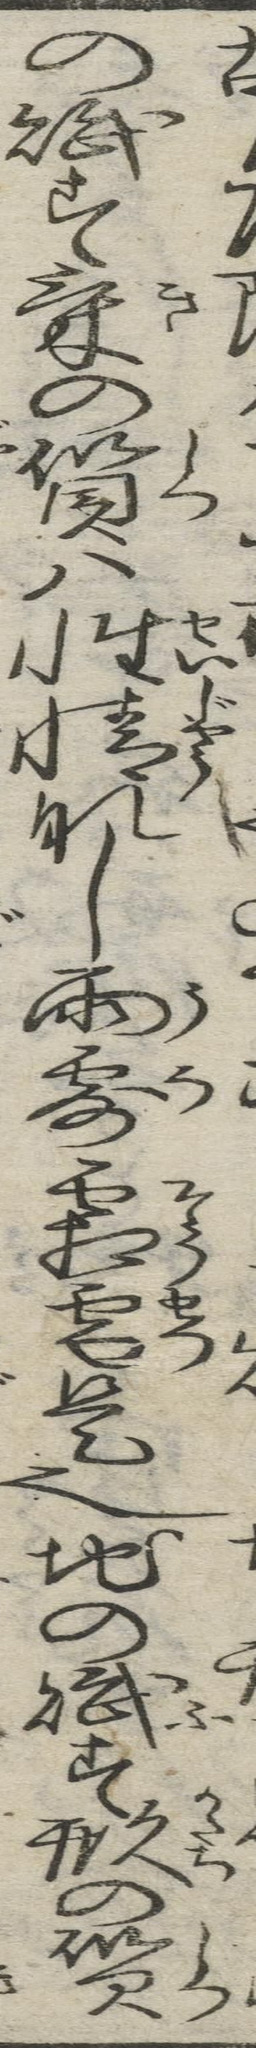の賦す気の質は性情なし雨露霜雪是也地の賦す形の質
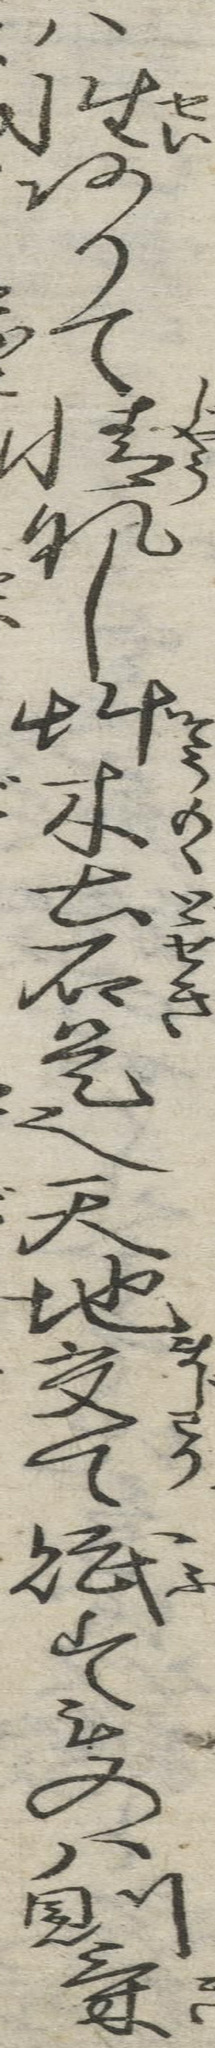は性ありて情なし草木土石是也天地交て賦すものは則気
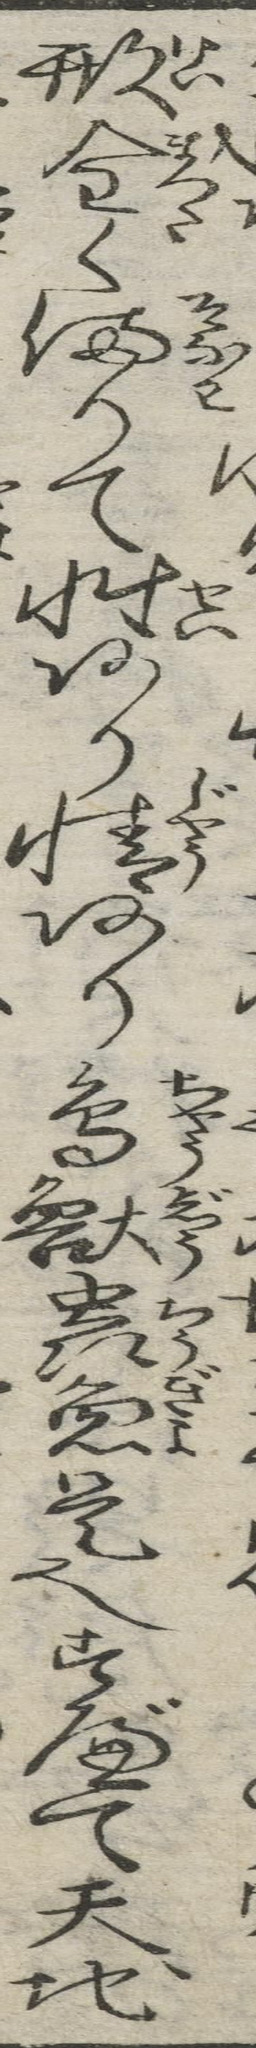形全く備りて性あり情あり鳥獣蟲魚是也すべて夫天地
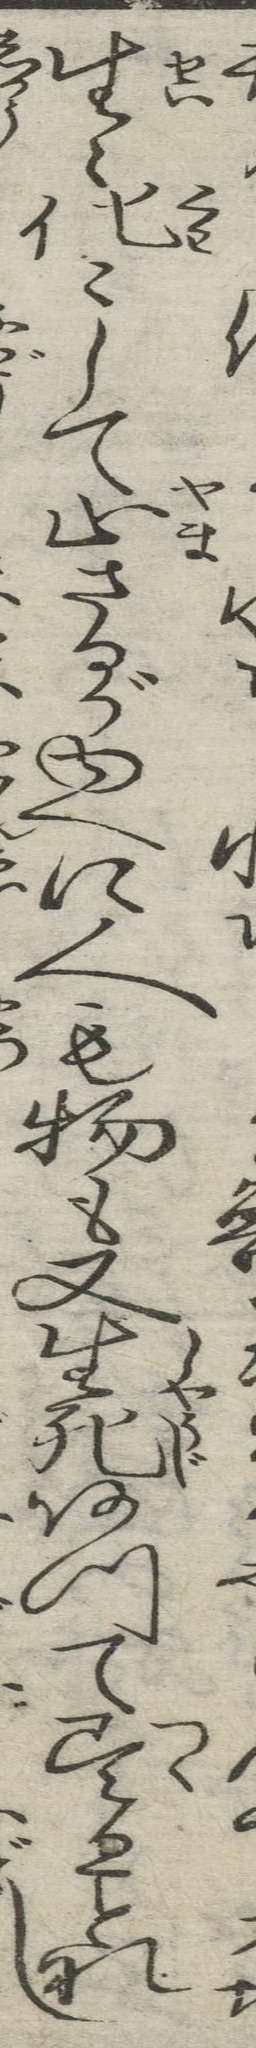生々化々して止さるがゆへに人も物も又生死あつて尽ることなし
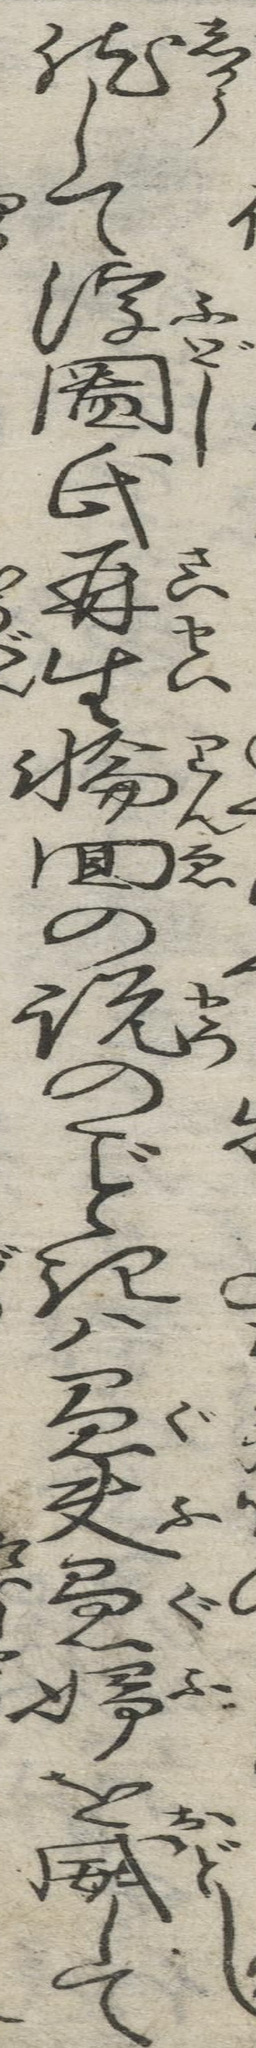然して浮圖氏再生輪回の説のごときは愚夫愚婦を威して
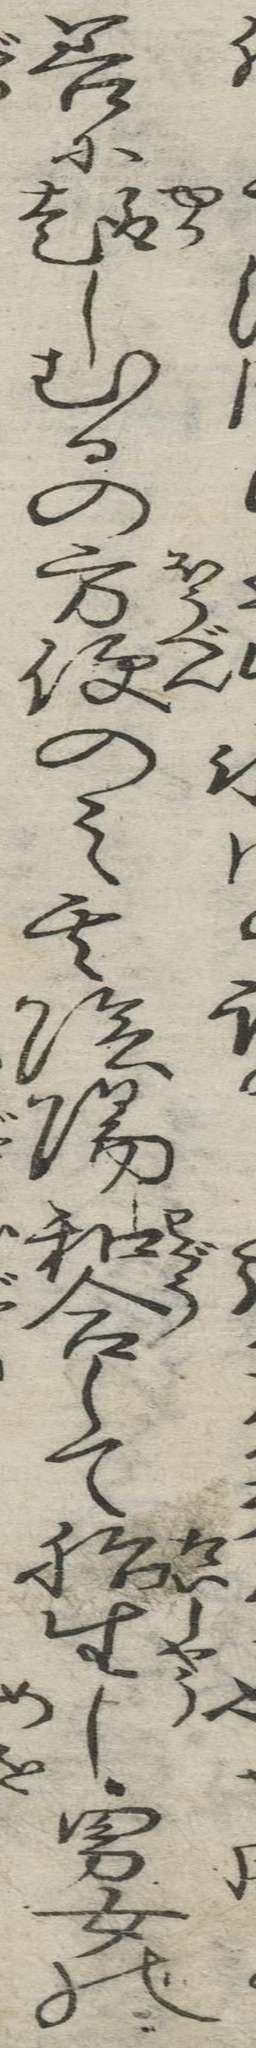善に趣しむるの方便のみ其陰陽和合して胎生し男女の
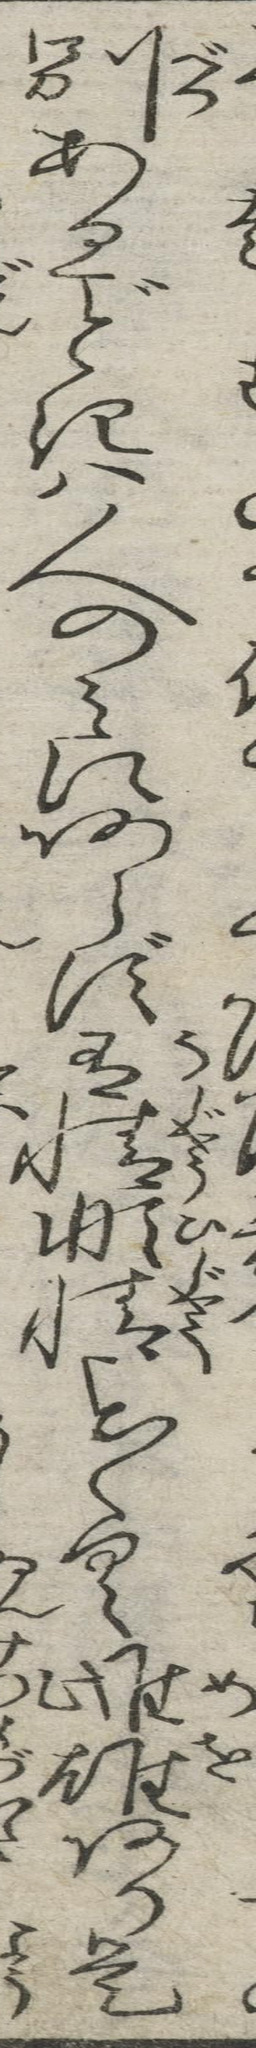別あるごときは人のみにあらず有情非情こと〳〵く雌雄あり是
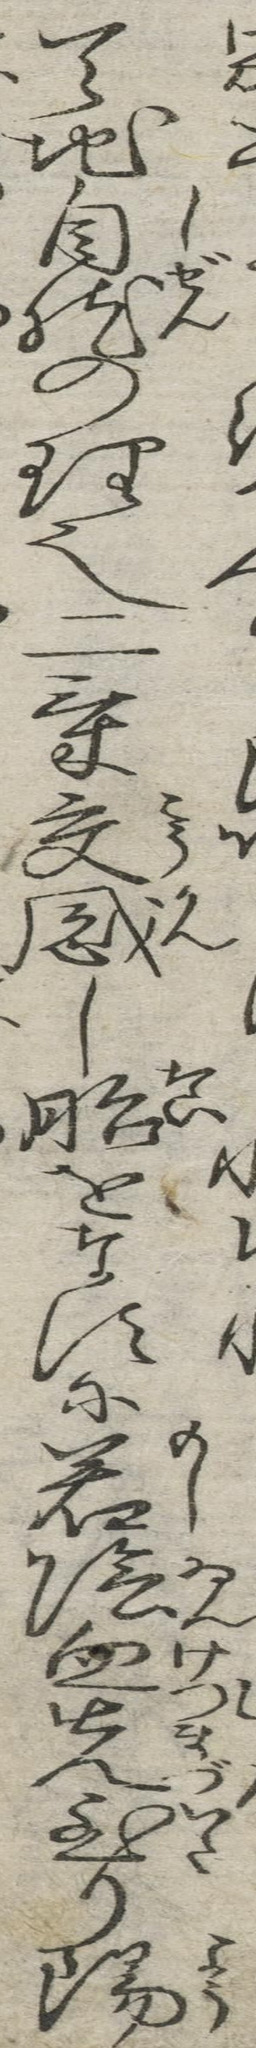天地自然の理也二気交感し胎をなすに若陰血先至り陽
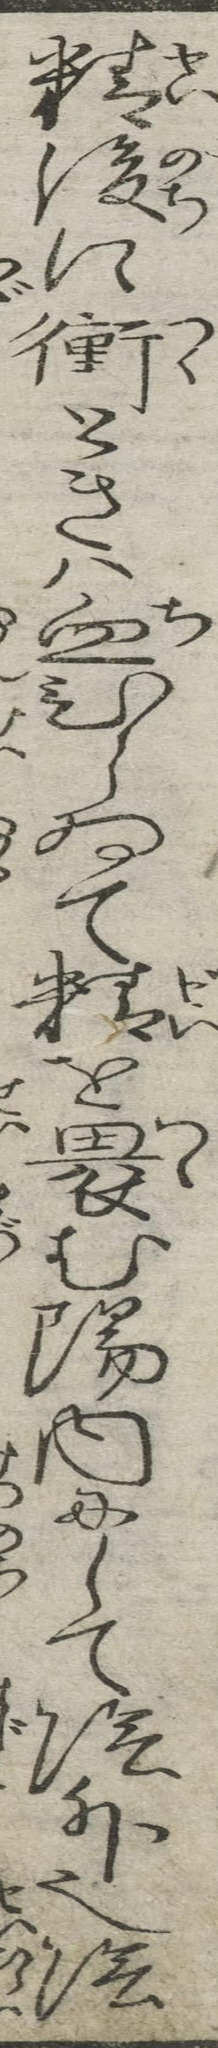精後に衝ときは血ひらゐて精を裹む陽内にして陰外也陰
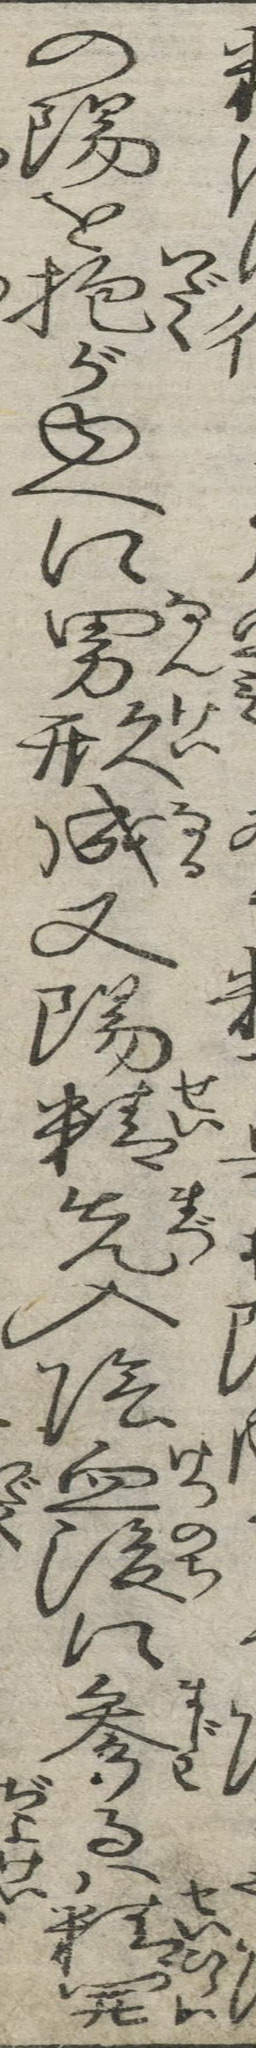の陽を抱がゆへに男形成又陽精先入陰血後に参るは精開
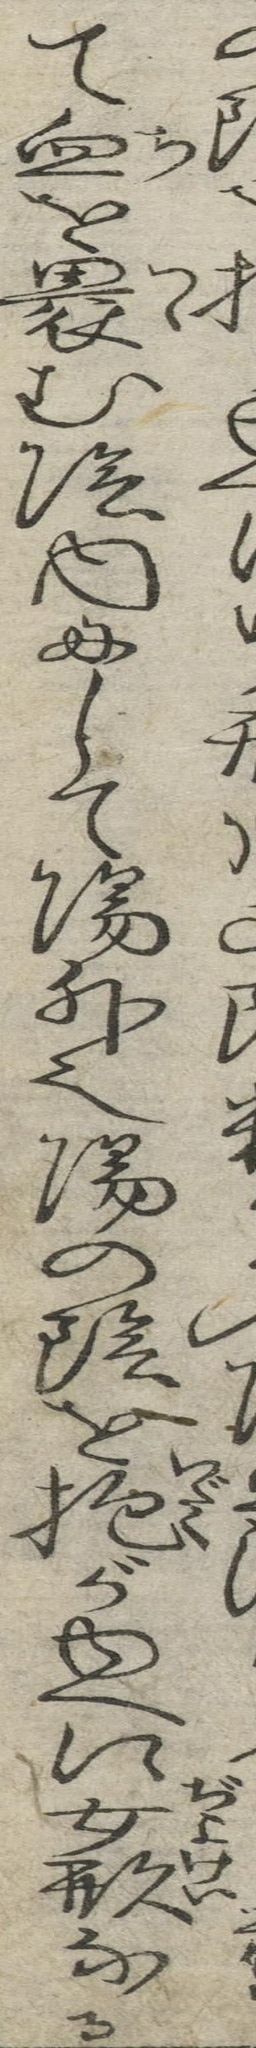て血を裹む陰内にして陽外也陽の陰を抱がゆへに女形なる

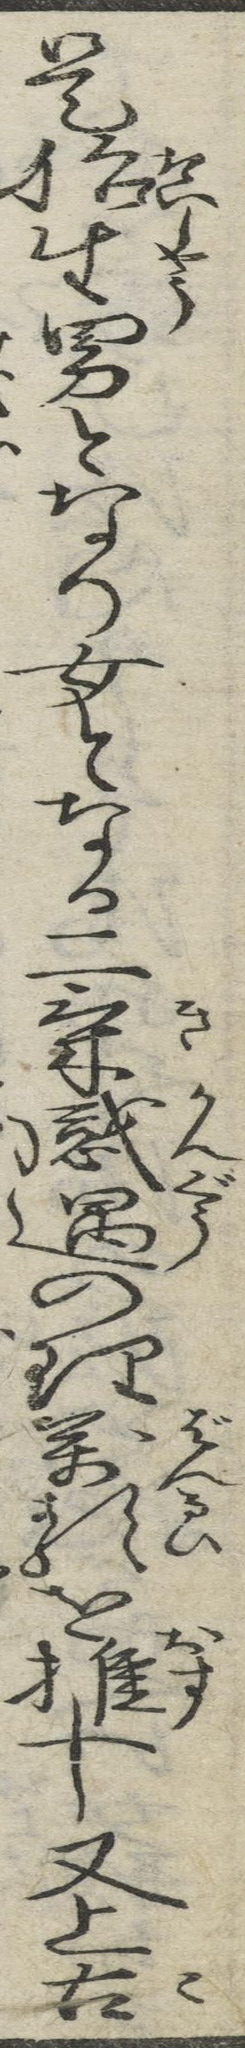是胎生男となり女となる二気感遇の理萬類を推へし又上古
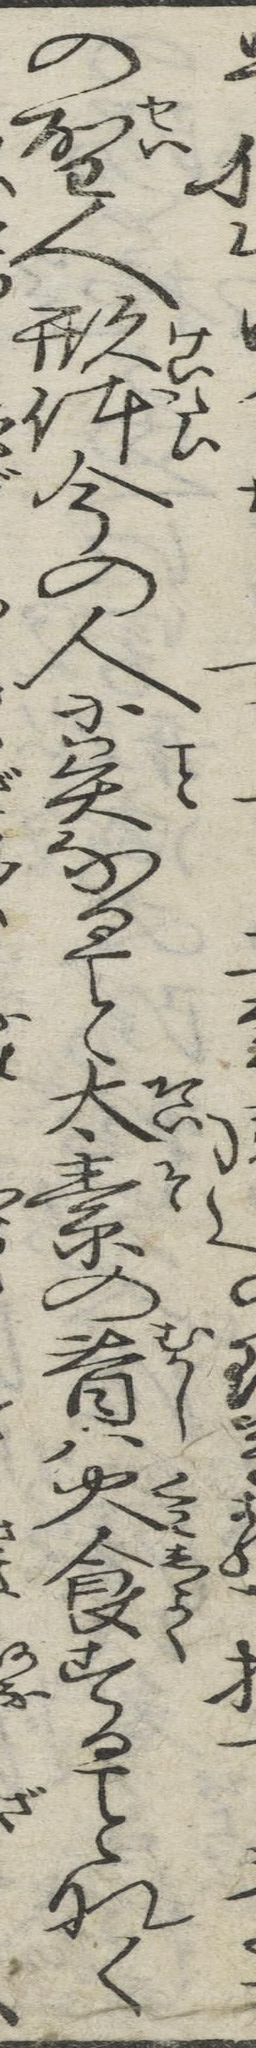の聖人形体今の人に異なること太素の昔は火食することなく
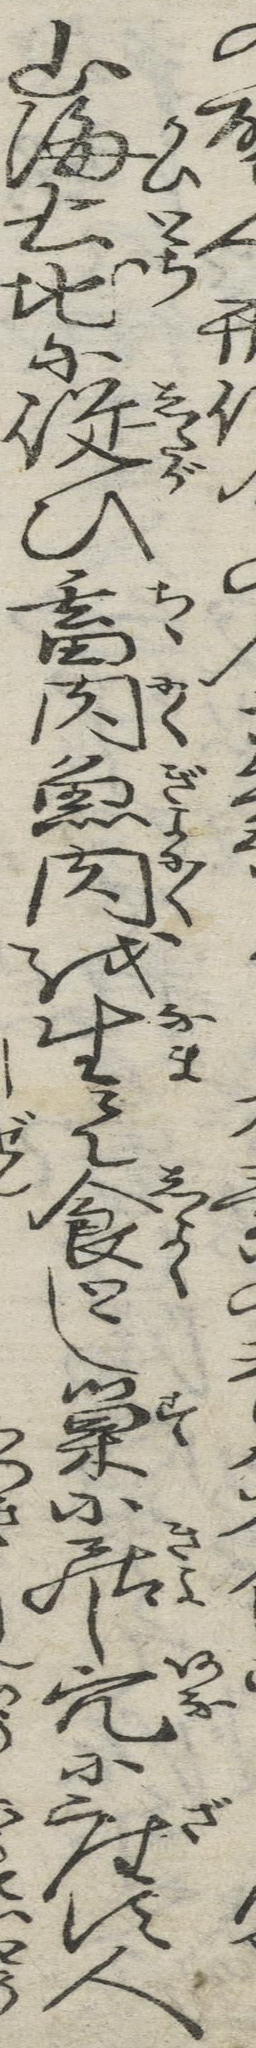山海土地に従ひ畜肉魚肉を生て食とし巣に居穴に座す人
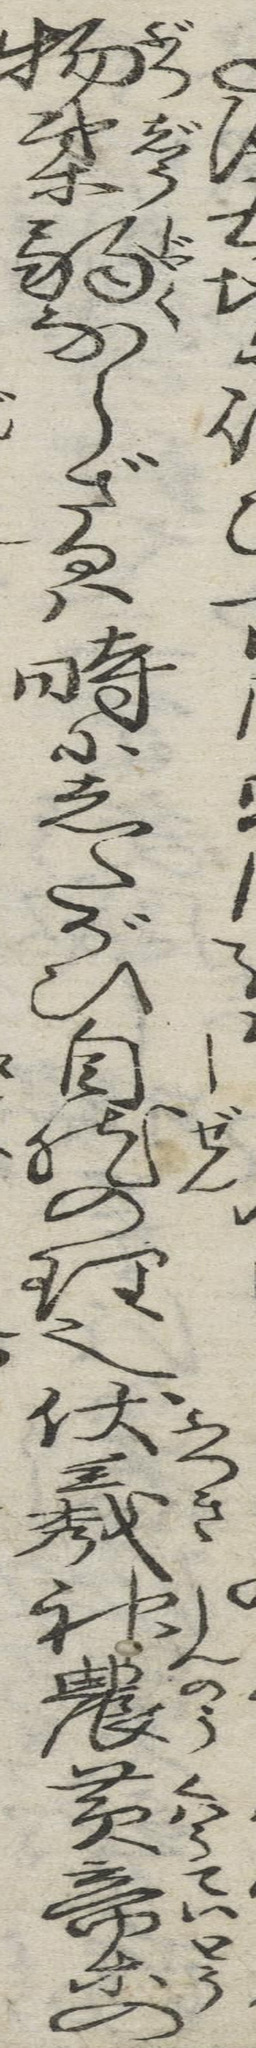物柔弱ならざるは時にしたがひ自然の理也伏羲神農黄帝等の
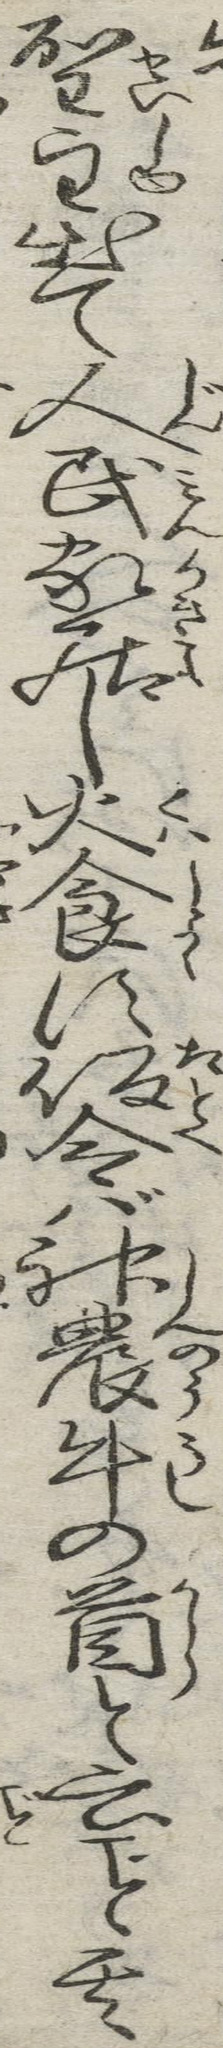聖主出て人民家居し火食す仮令ば神農牛の首と云こと其
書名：訓蒙天地辨　人
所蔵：東京大学地震研究所図書室 Earthquake Research Institute Library, The University of Tokyo, JAPAN
